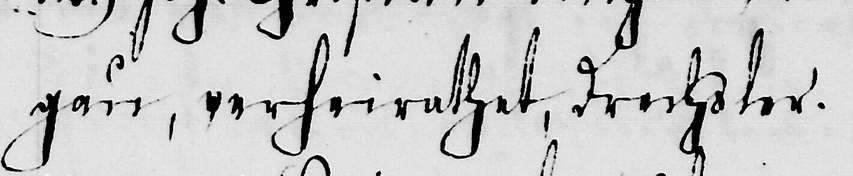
gau, verheirathet, Drechsler.
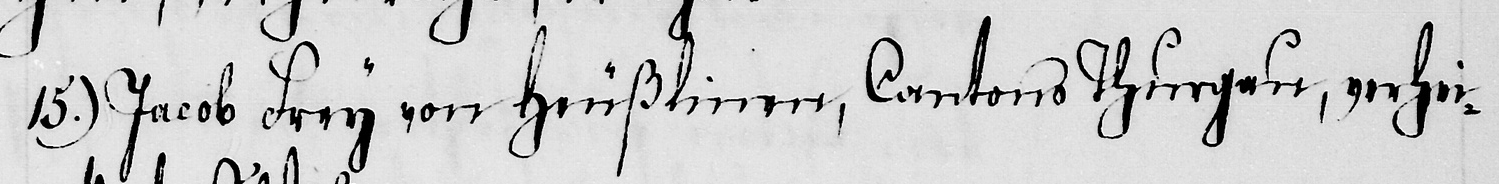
15.) Jacob Frey von Heußlinen, Cantons Thurgau, verhei¬
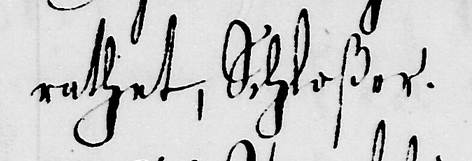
ratet, Schloßer.
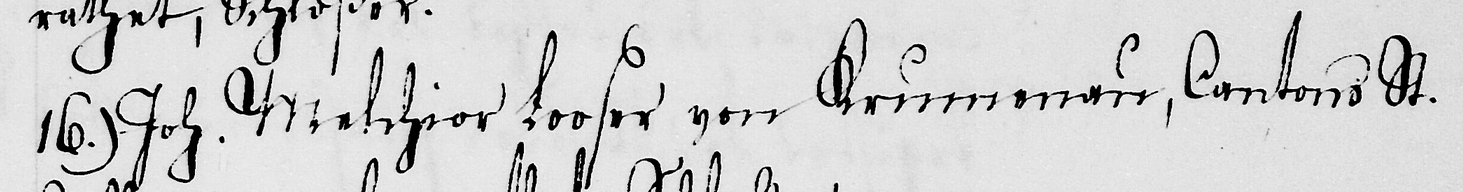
16.) Joh. Melchior Looser von Krummenau, Cantons St.
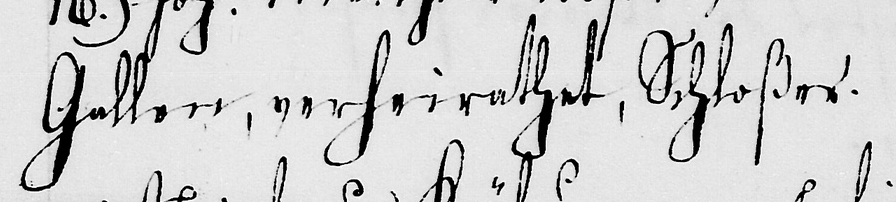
Gallen, verheirathet, Schloßer.
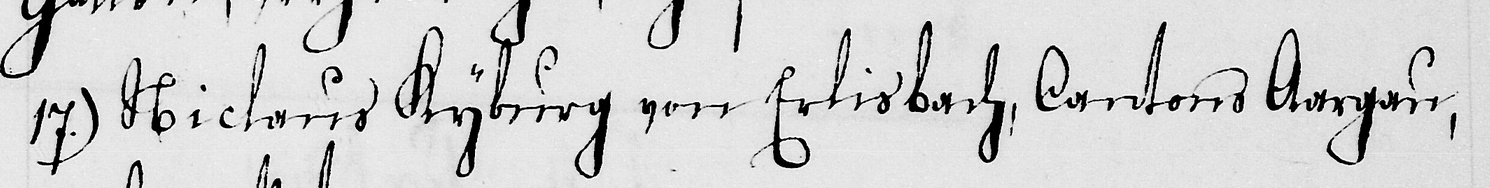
17.) Niclaus Kyburg von Erlisbach, Cantons Aargau,
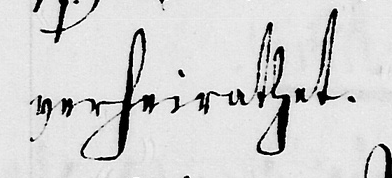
verheiratet.
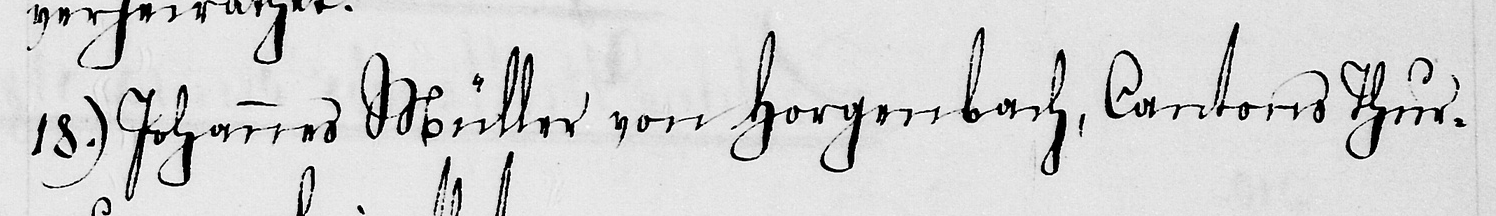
18.) Johannes Müller von Horgenbach, Cantons Thur¬
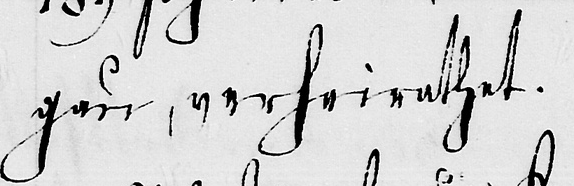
gau, verheirathet.
